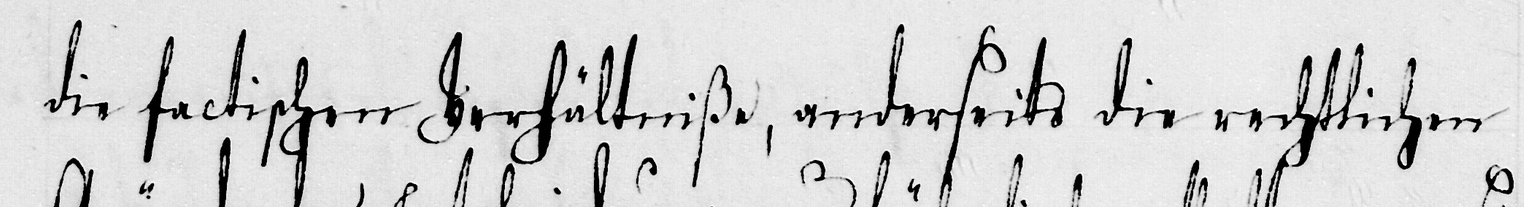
die factischen Verhältniße, anderseits die rechtlichen
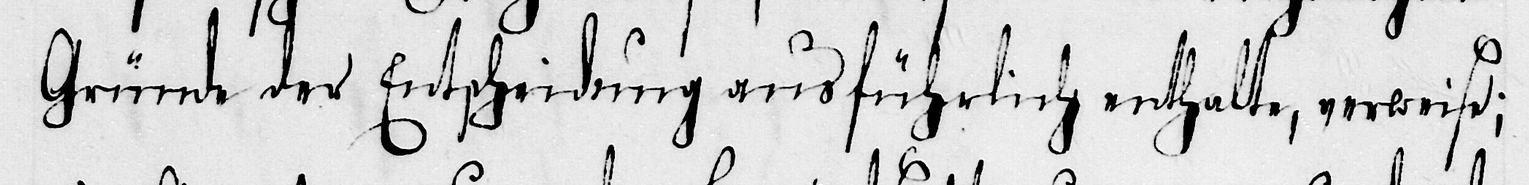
Gründe der Entscheidung ausführlich enthalte, verweise;
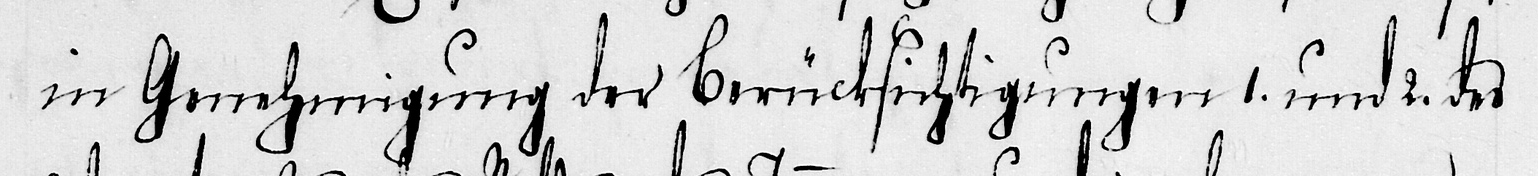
in Genehmigung der Berücksichtigungen 1. und 2. des
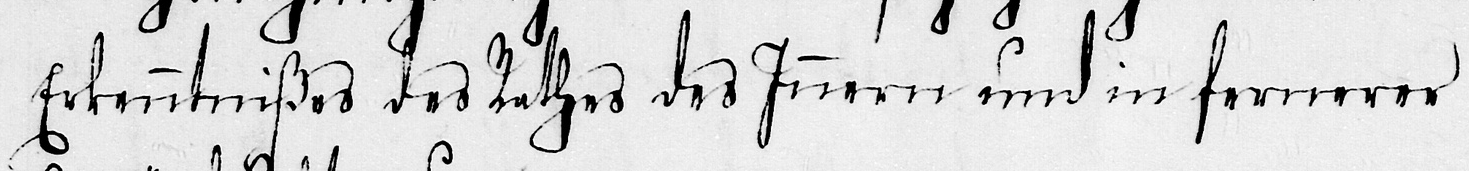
Erkenntnißes des Rathes des Innern und in fernerer
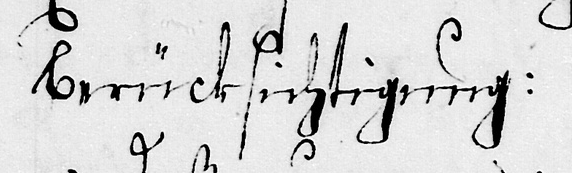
Berücksichtigung:
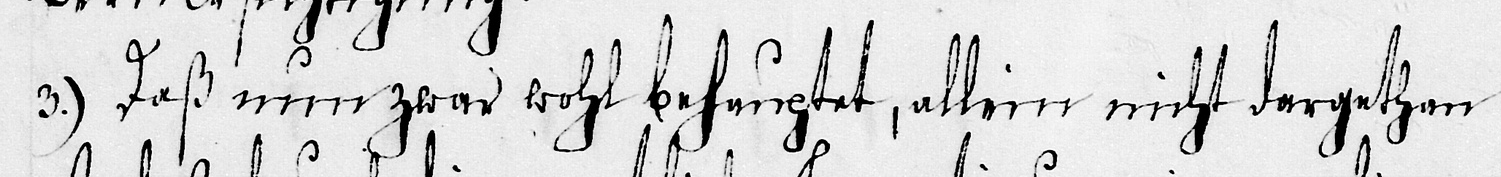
3.) Daß nun zwar wohl behauptet, allein nicht dargethan
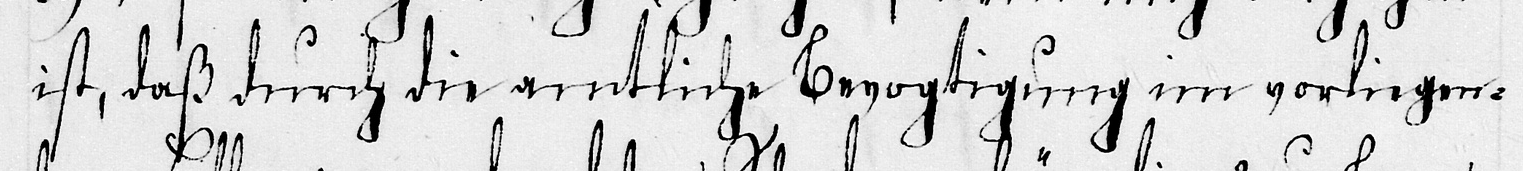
ist, daß durch die amtliche Bevogtigung im vorliegen¬
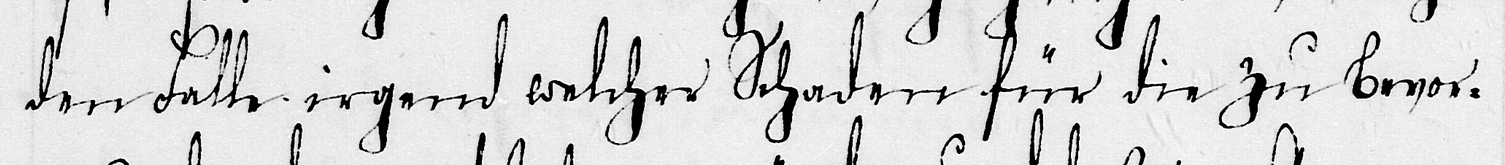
den Falle irgend welcher Schaden für die zu Bevor¬
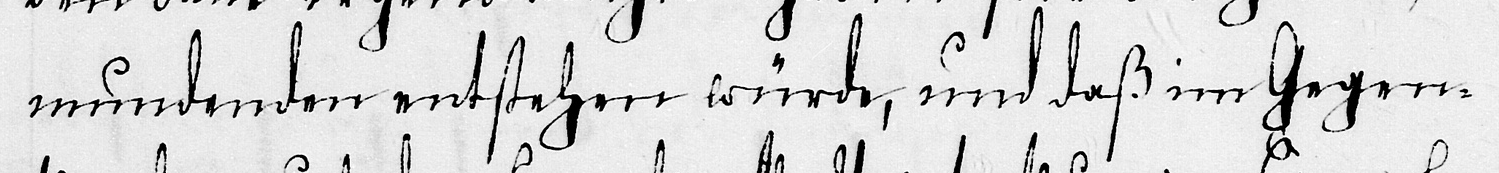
mundenden entstehen würde, und daß im Gegen¬
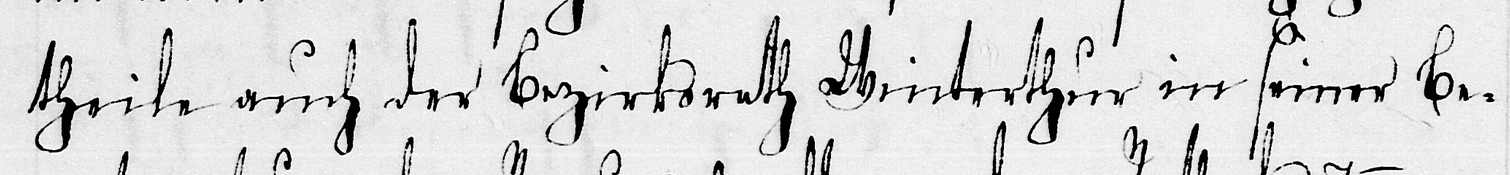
theile auch der Bezirksrath Winterthur in seiner Be¬
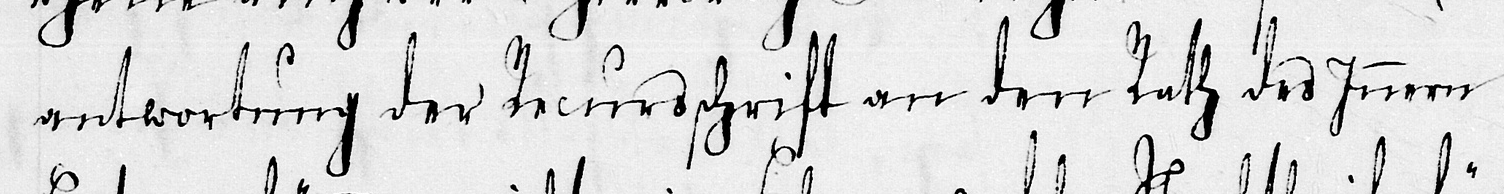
antwortung der Recursschrift an den Rath des Innern
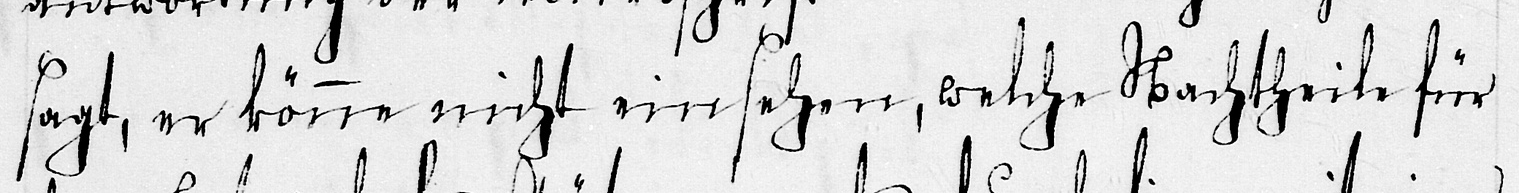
sagt, er könne nicht einsehen, welche Nachtheile für
